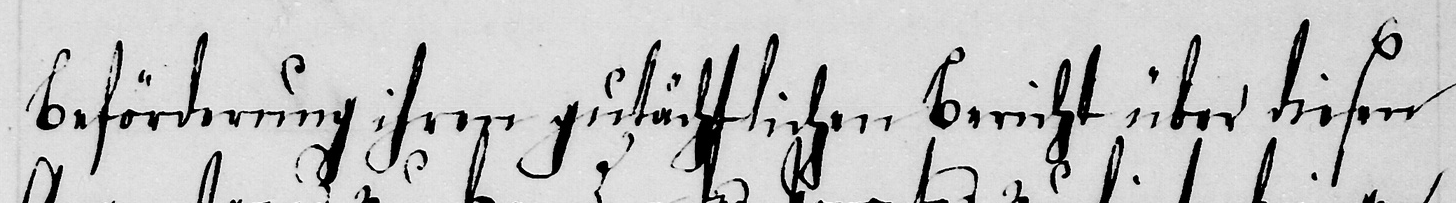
Beförderung ihren gutächtlichen Bericht über diesen
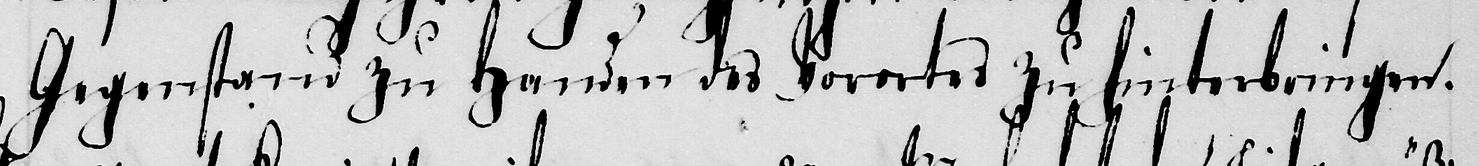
Gegenstand zu Handen des Vorortes zu hinterbringen.
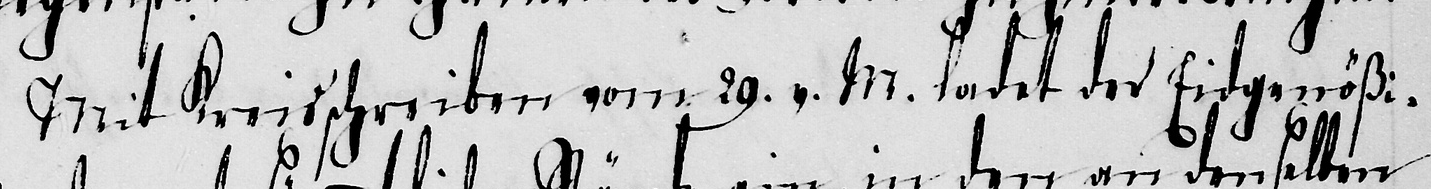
Mit Kreisschreiben vom 29. v. M. ladet der Eidgenößi¬
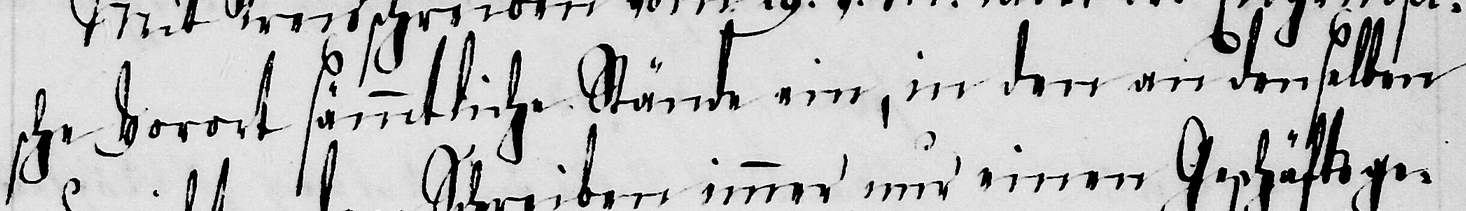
sche Vorort sämmtliche Stände ein, in den an denselben
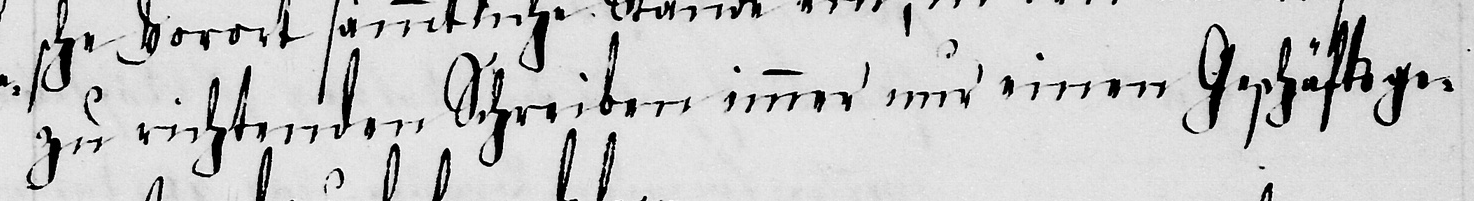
zu richtenden Schreiben immer nur einen Geschäftsge¬
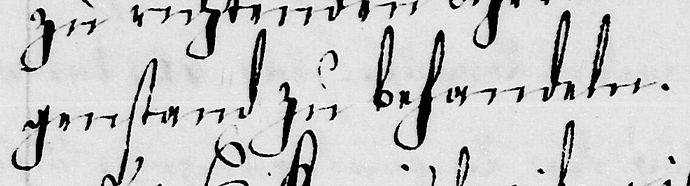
genstand zu behandeln.
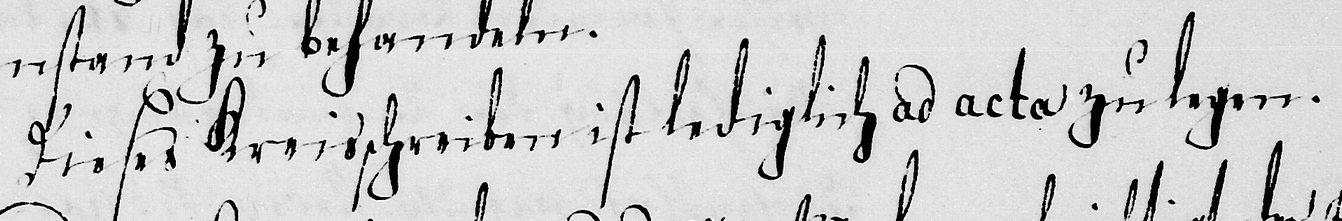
Dieses Kreisschreiben ist lediglich ad acta zu legen.
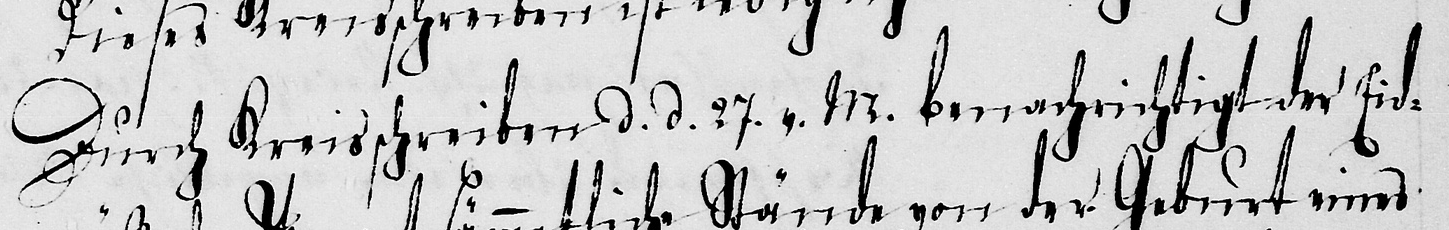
Durch Kreisschreiben d. d. 27. v. M. benachrichtigt der Eid¬
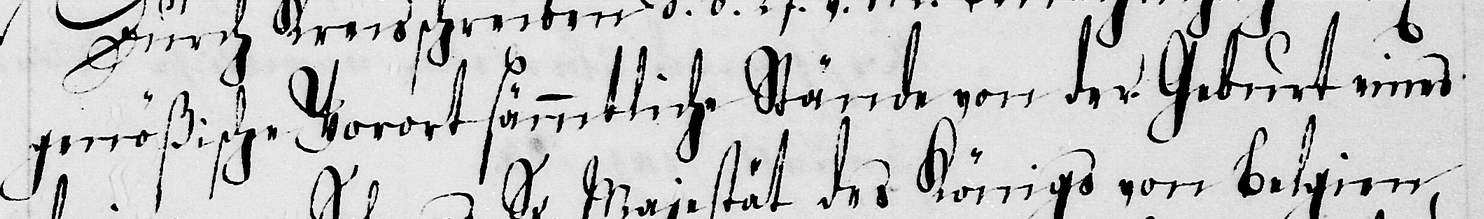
genößische Vorort sämmtliche Stände von der Geburt eines
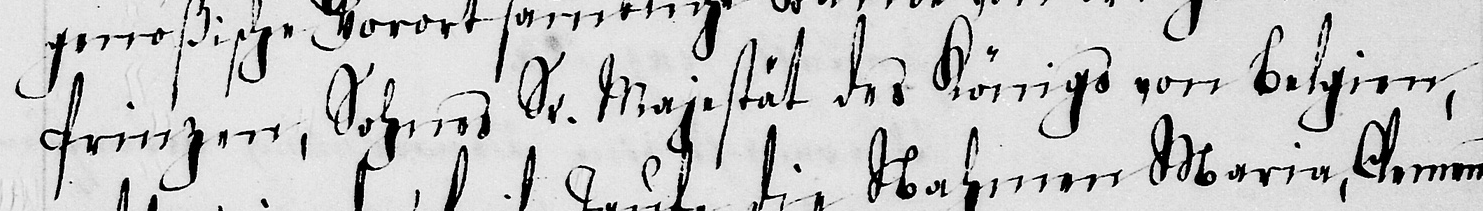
Prinzen, Sohnes Sr. Majestät des Königs von Belgien,
